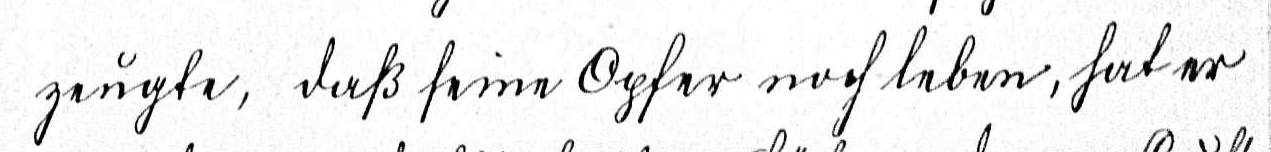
zeugte, daß seine Opfer noch leben, hat er
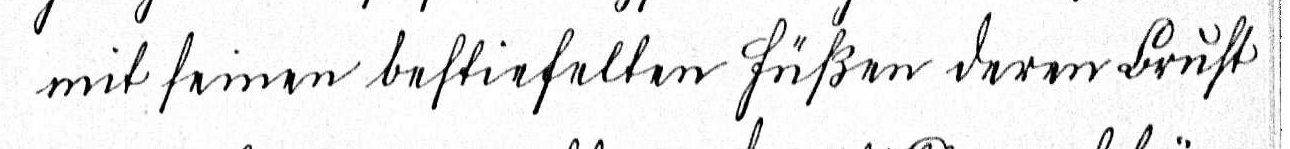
mit seinen bestiefelten Füßen deren Brust
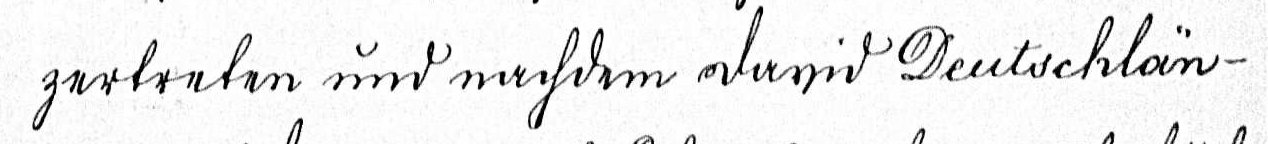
zertreten und nachdem David Deutschlän¬
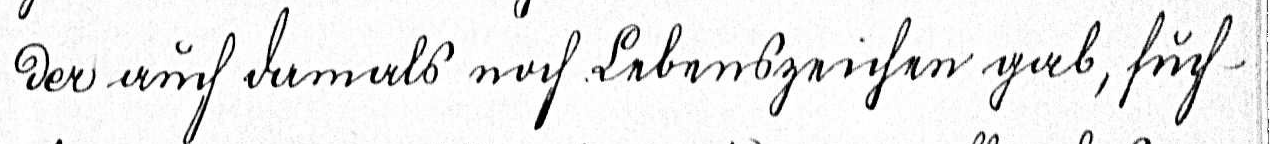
der auch damals noch Lebenszeichen gab, such¬
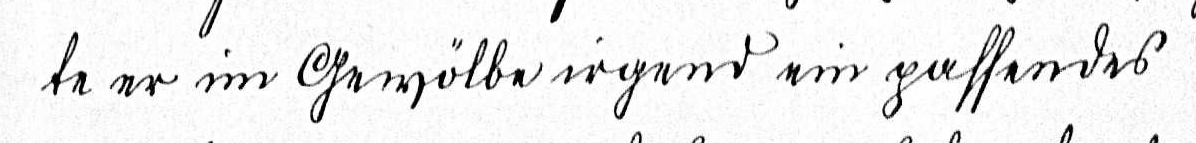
te er im Gewölbe irgend ein passendes
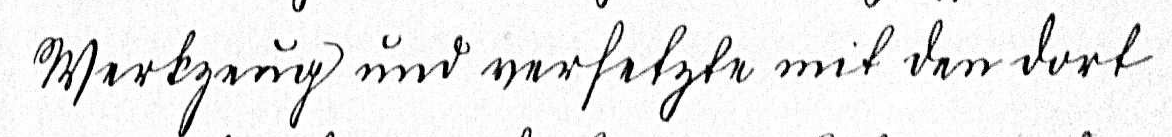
Werkzeug und versetzte mit den dort
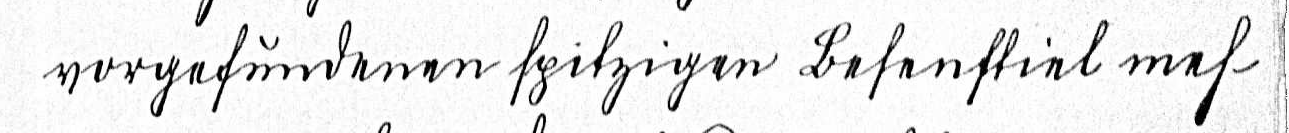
vorgefundenen spitzigen Besenstiel meh¬
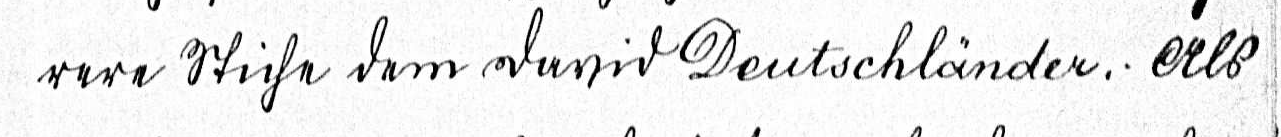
rere Stiche dem David Deutschländer. Als
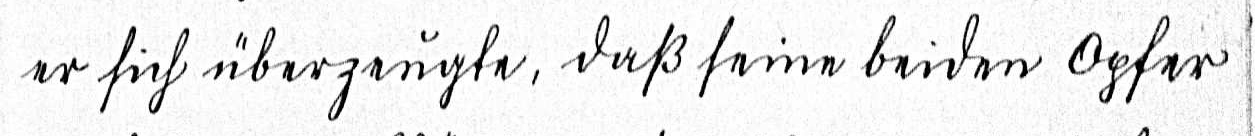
er sich überzeugte, das seine beiden Opfer
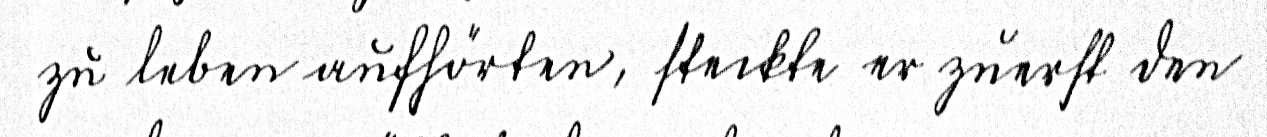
zu leben aufhörten, steckte er zuerst den
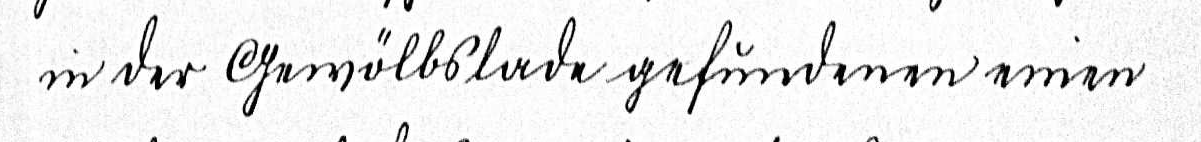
in der Gewölbslade gefundenen einen
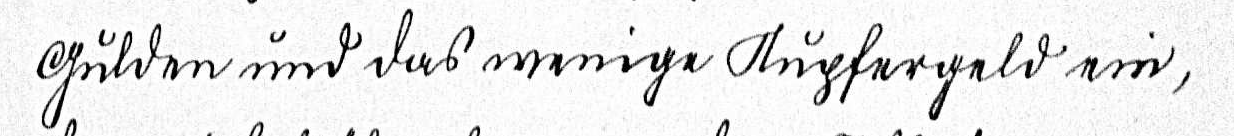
Gulden und das wenige Kupfergeld ein,
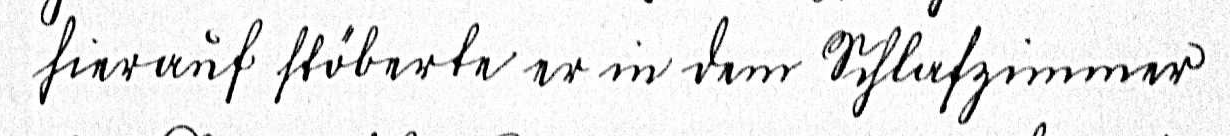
hierauf stöberte er in dem Schlafzimmer
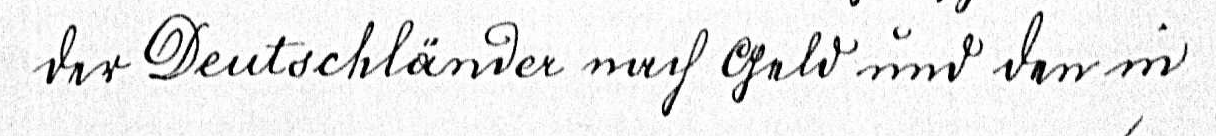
der Deutschländer nach Geld und den in
